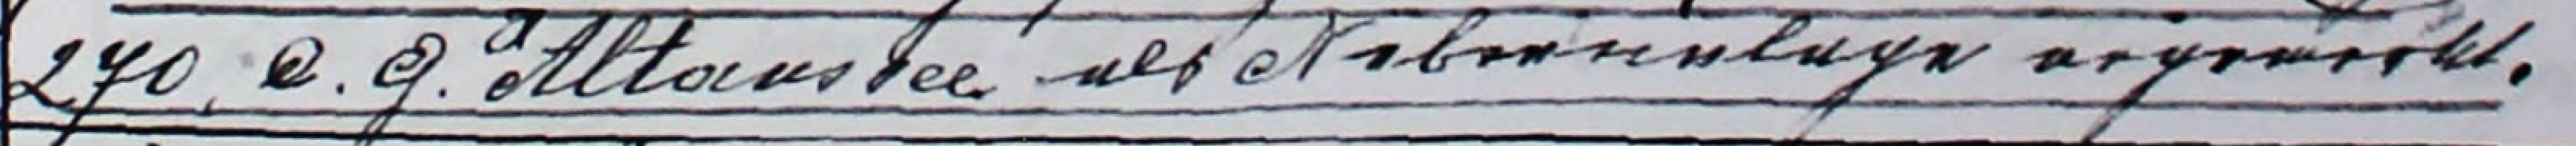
270, C.G. Altaussee als Nebeneinlage angemerkt.
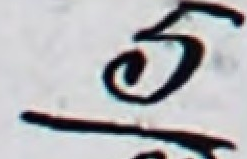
5
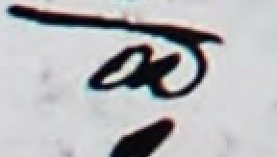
ad
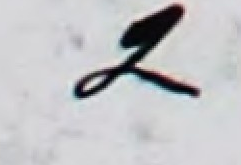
2
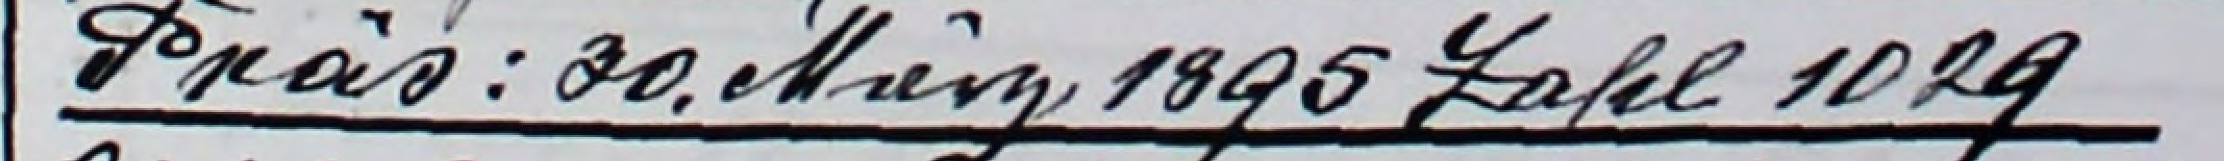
Präs: 30. März 1895 Zahl 1029
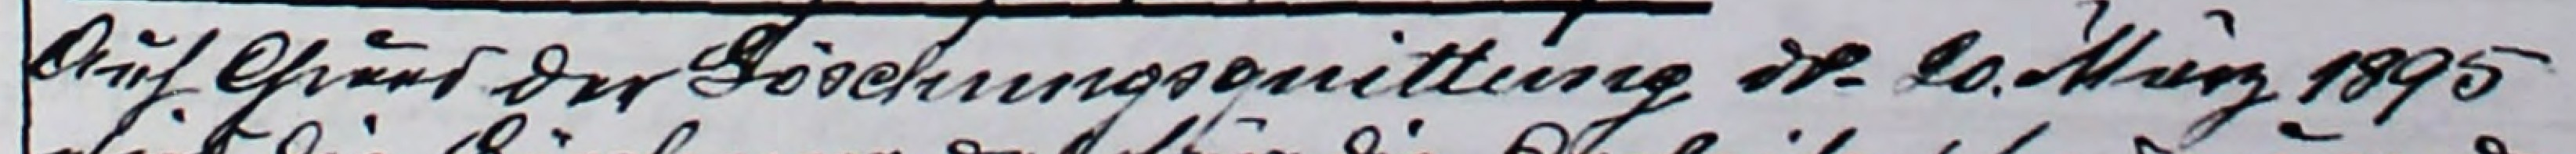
Auf Grund der Löschungsquittung ddo. 20. März 1895
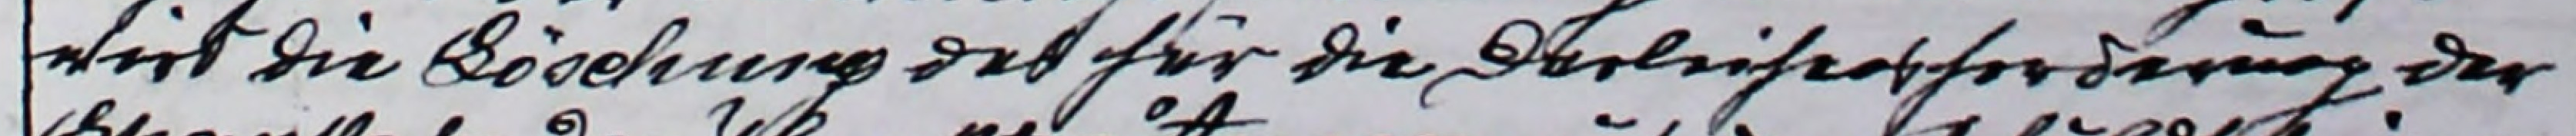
wird die Löschung des für die Darleihenforderung der
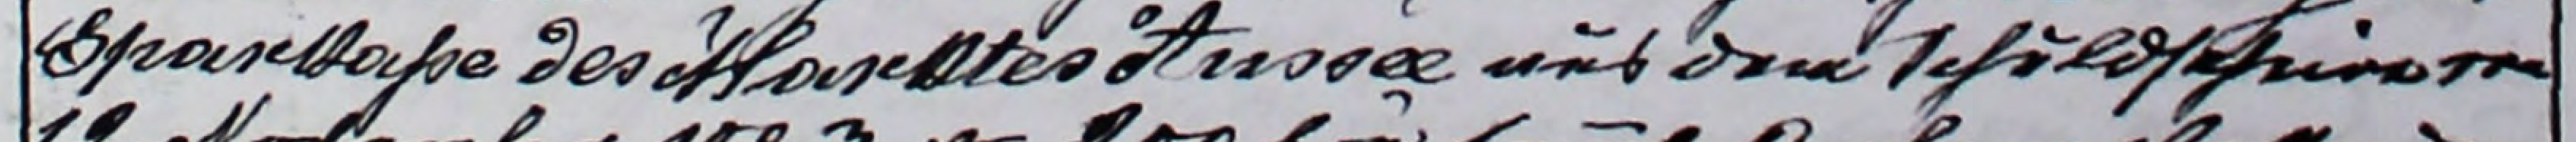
Sparkasse des Marktes Aussee aus dem Schuldscheine vom
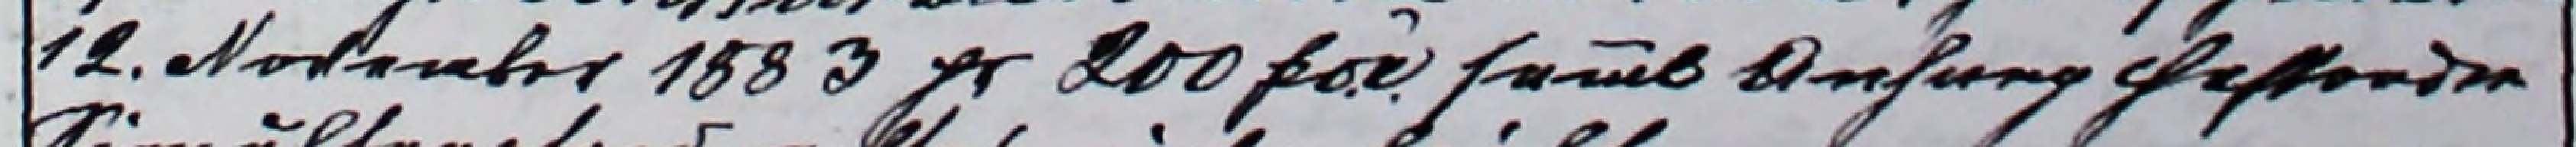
12. November 1883 pr 200 fl ö.k. sammt Anhang Gastenden
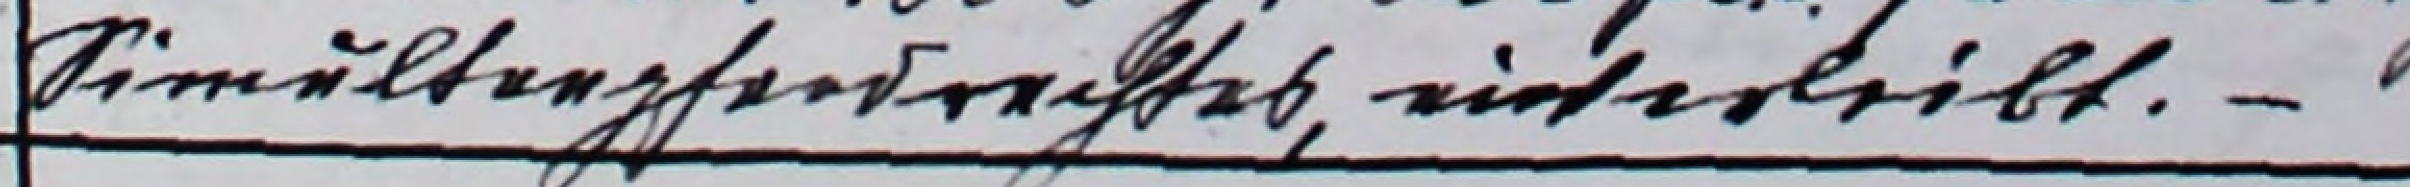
Simultanpfandrechtes, einverleibt.-
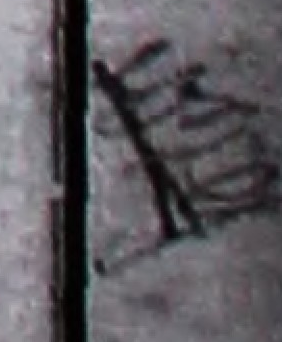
1029
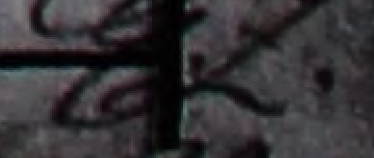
EZ.
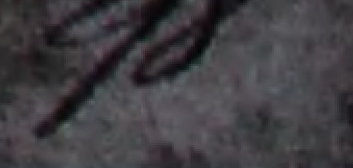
98
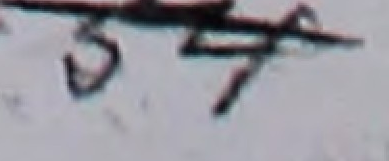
54
